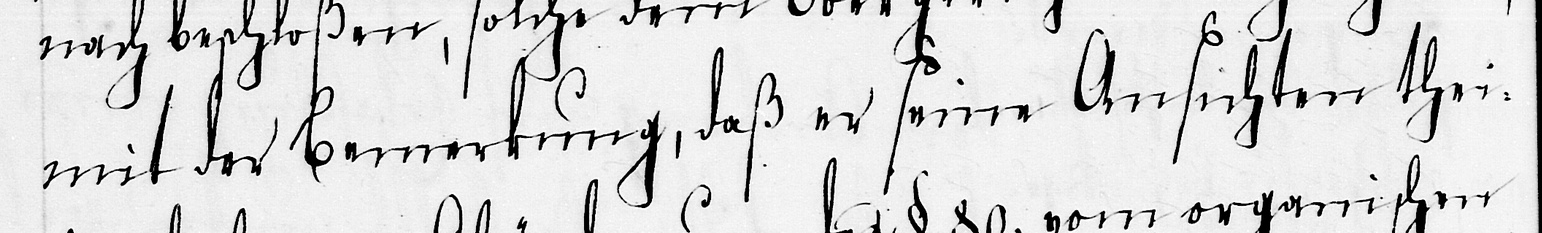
mit der Bemerkung, daß er seine Ansichten thei¬
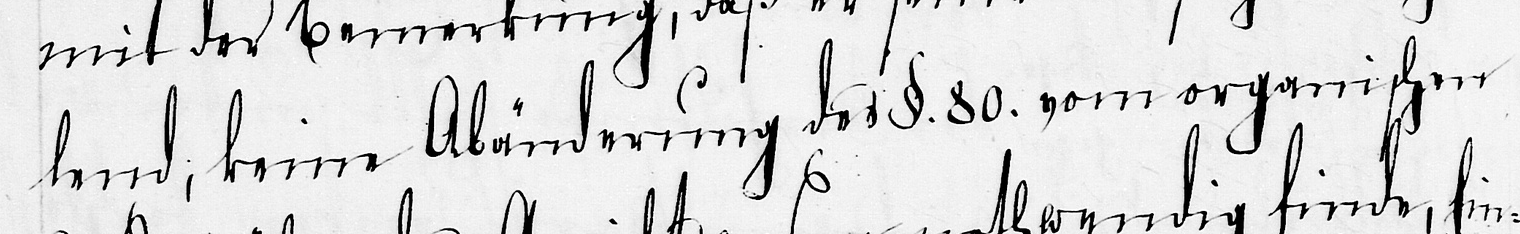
lend; keine Abänderung des §. 80. vom organischen
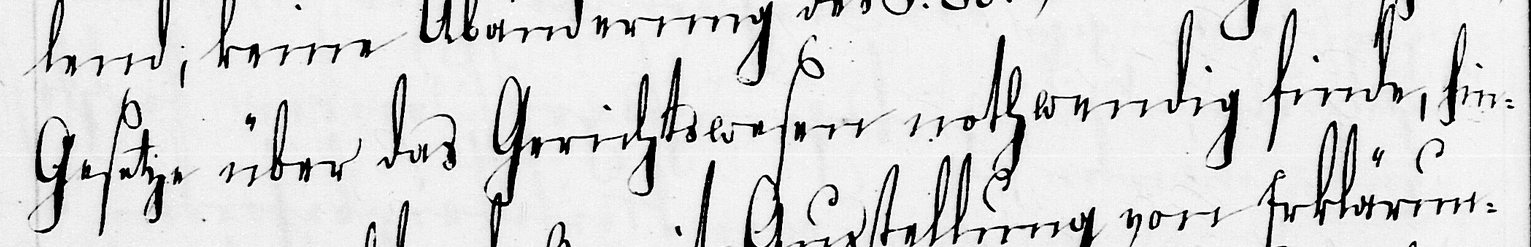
Gesetze über das Gerichtswesen nothwendig finde, hi¬
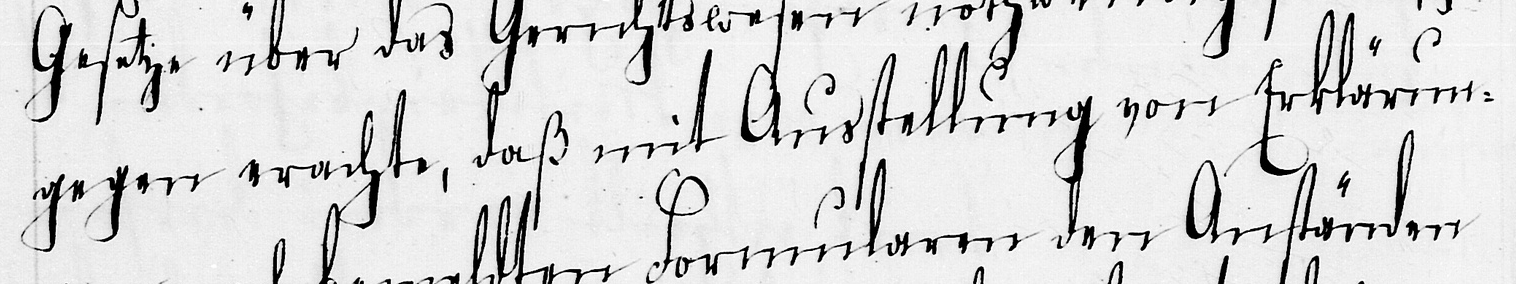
ngegen erachte, daß mit Austellung von Erklärun¬
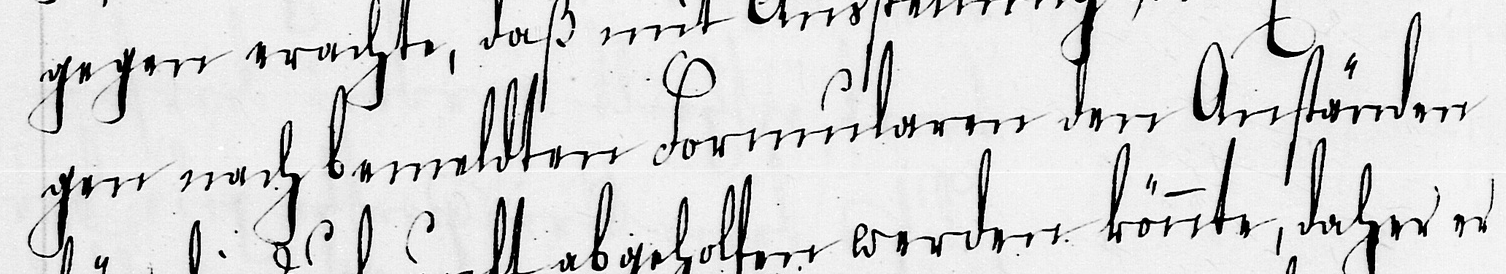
gen nach bemeldten Formularen den Anständen
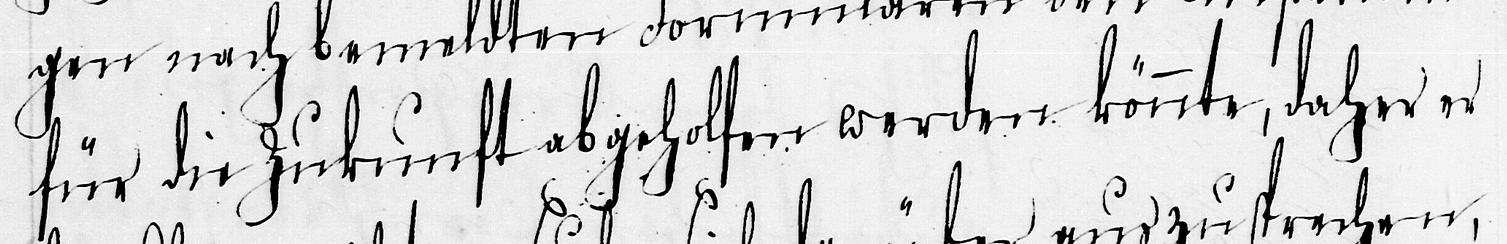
für die Zukunft abgeholfen werden könnte, daher er
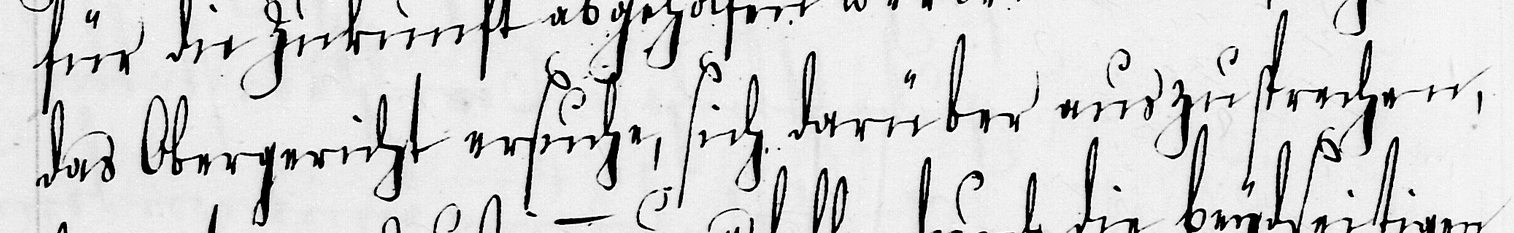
das Obergericht ersuche, sich darüber auszusprechen,
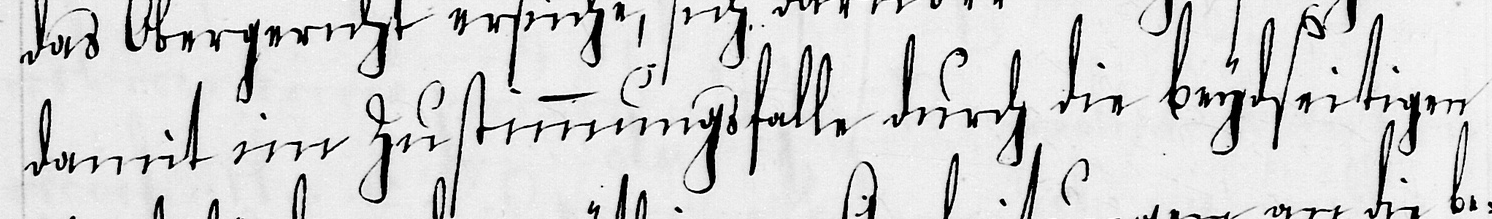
damit im Zustimmungsfalle durch die beydseitigen
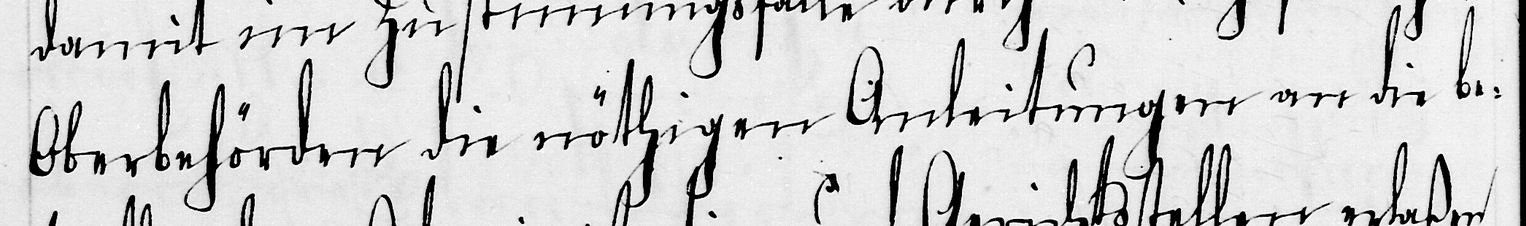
Oberbehörden die nöthigen Anleitungen an die be¬
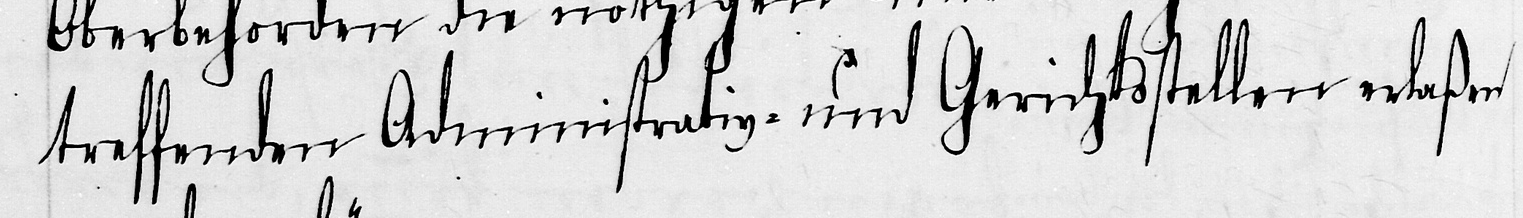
treffenden Administrativ- und Gerichststellen erlaßen
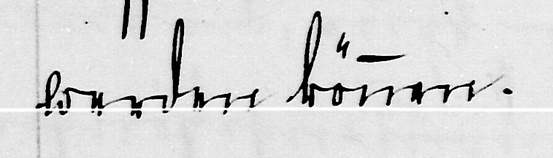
werden können.
